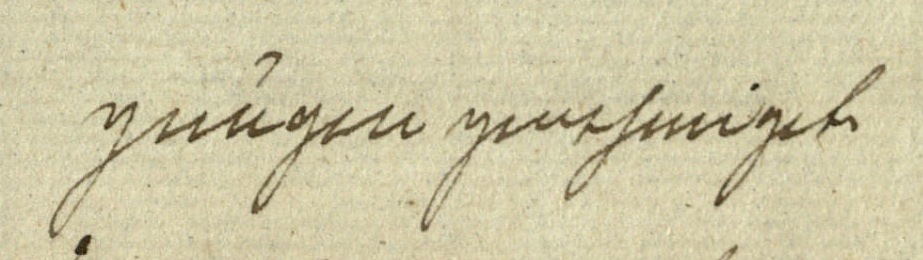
gungen genehmiget.
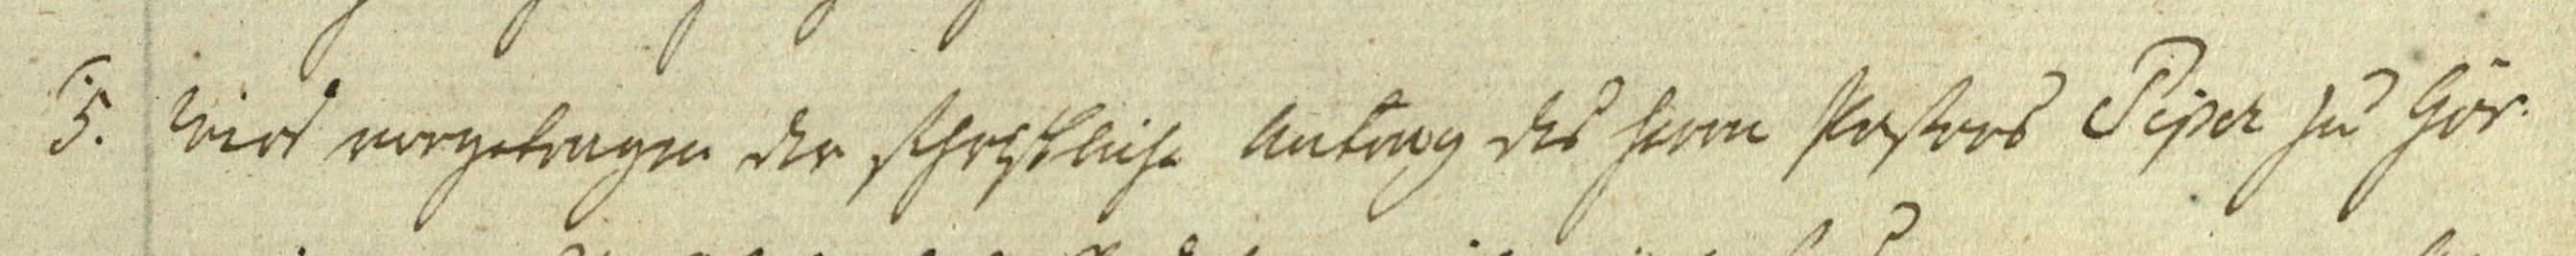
5. Wird vorgetragen der schriftliche Antrag des Herrn Pastors Piper zu Gör¬
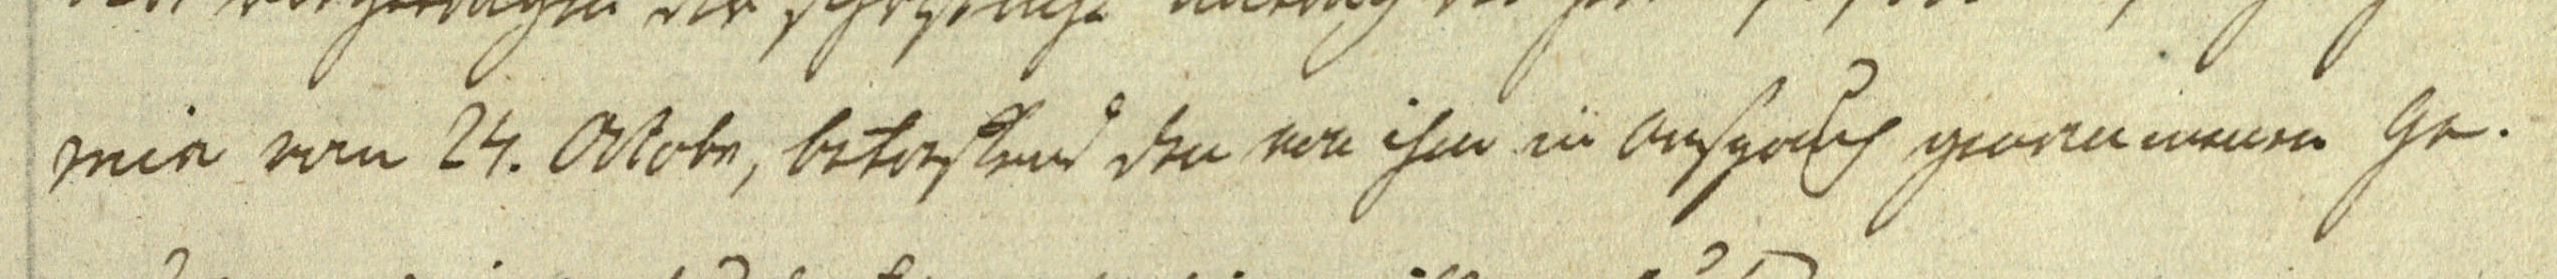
min vom 24. Octobr, betreffend den von ihm in Anspruch genommenen Ge¬
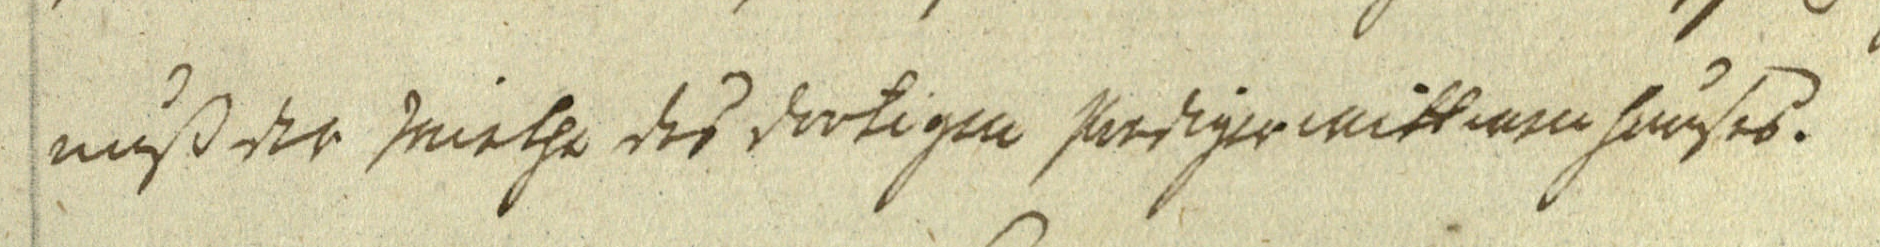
muß der Miethe des dortigen Predigerwittwenhauses.
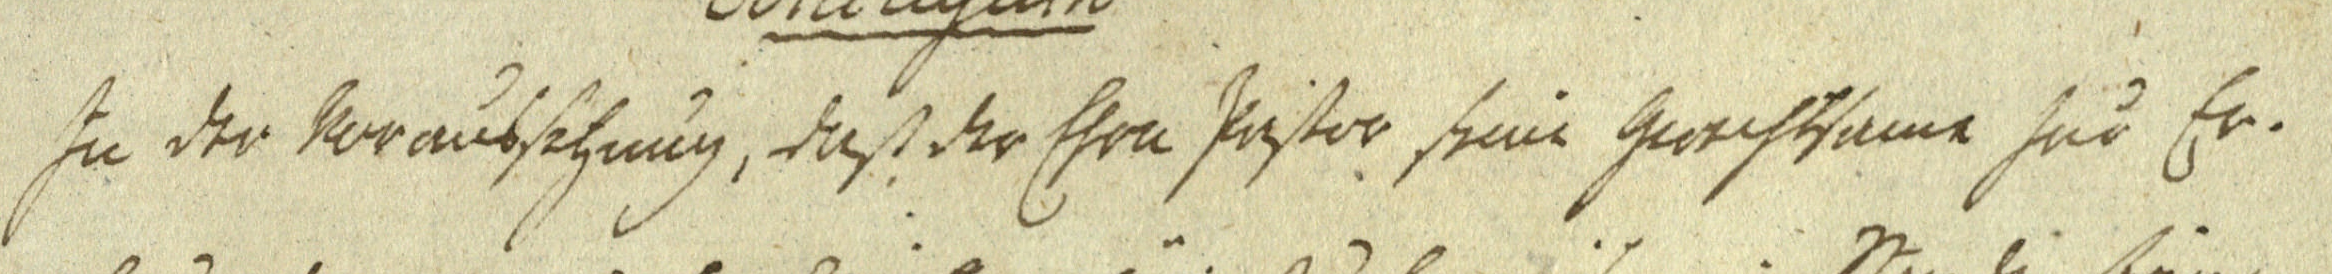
In der Voraussetzung, daß der Ehrn Pastor seine Gerechtsame zur Er¬
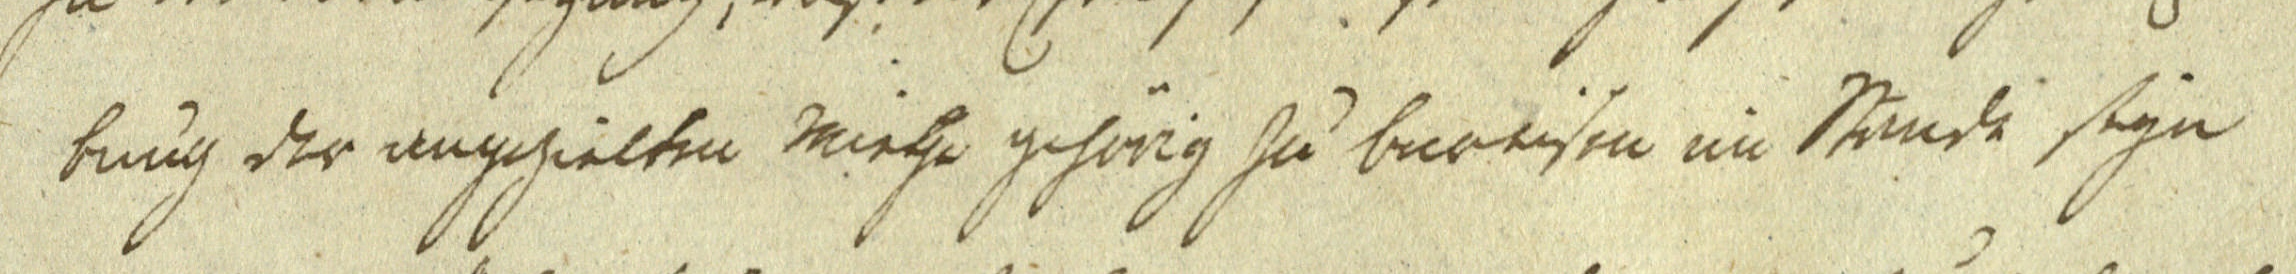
bung der angezielten Miethe gehörig zu beweisen in Stande seÿn
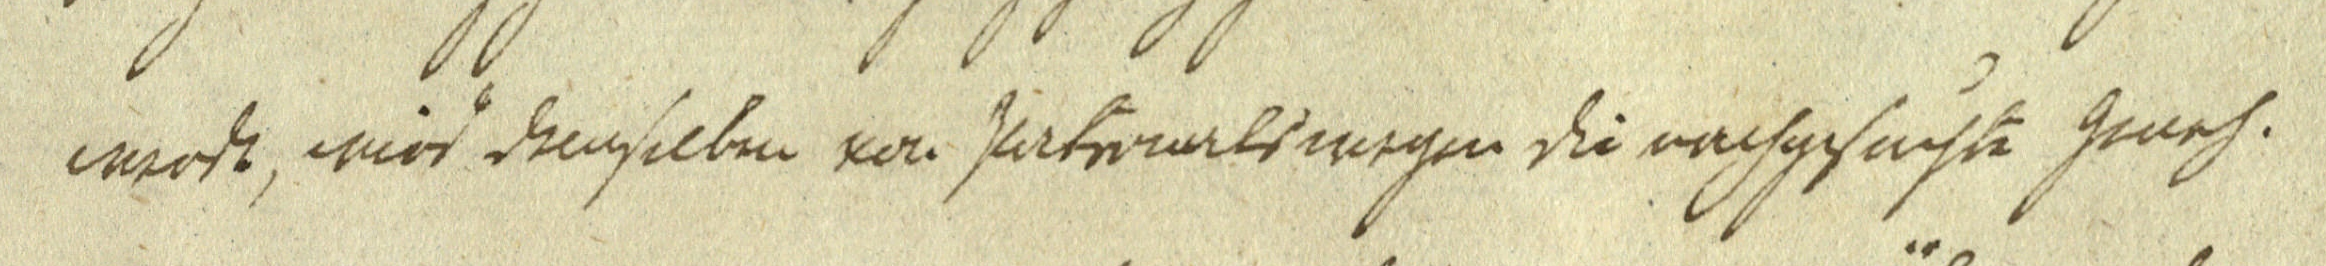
werde, wird demselben von Patronatswegen die nachgesuchte Geneh¬
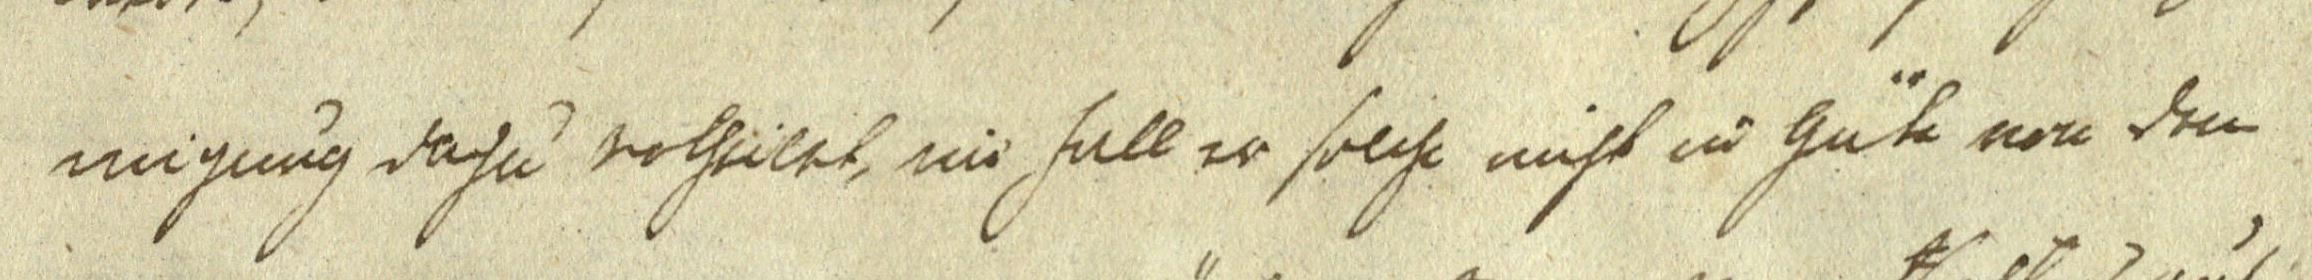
migung dazu ertheilet, im Fall er solche nicht in Güte von den
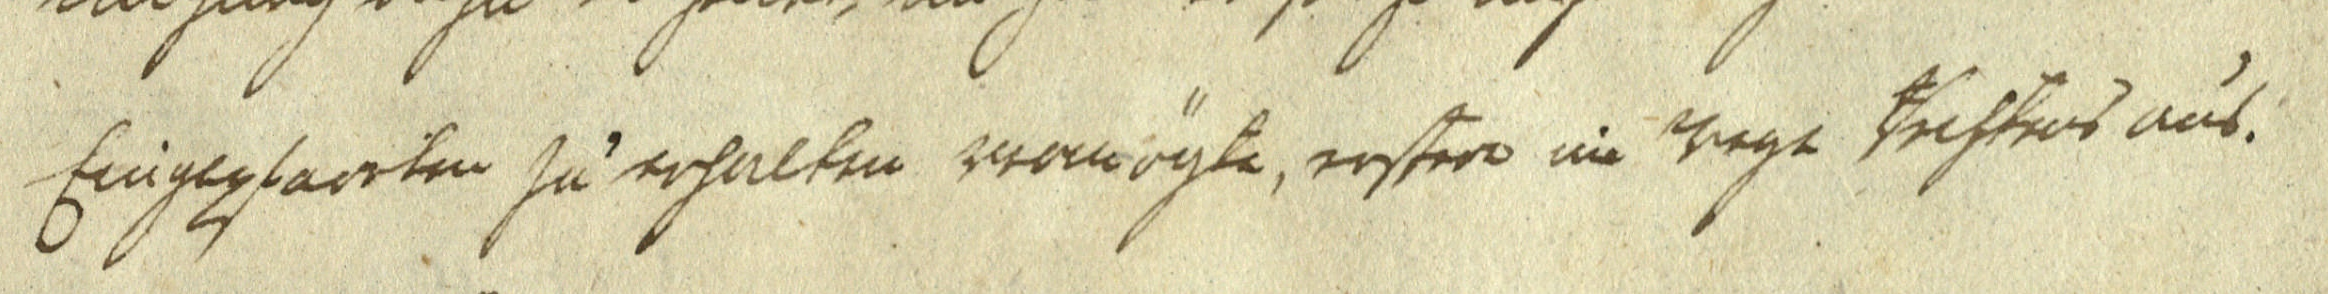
Eingepfarrten zu erhalten vermögte, erstere im Wege Rechtens aus¬
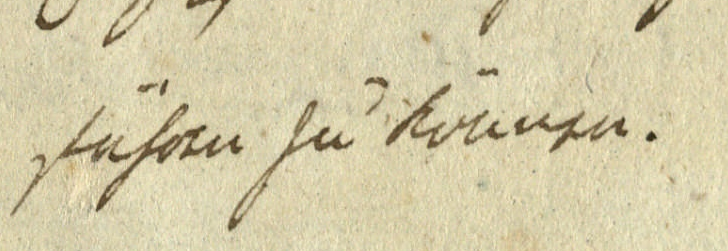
führen zu können.
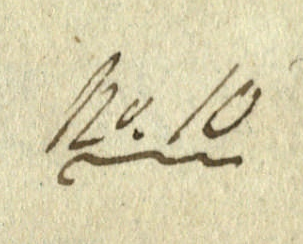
Nº 10
